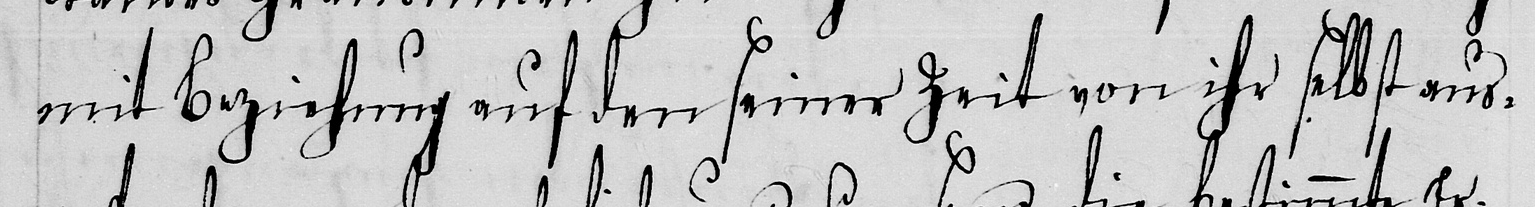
mit Beziehung auf den seiner Zeit von ihr selbst aus¬
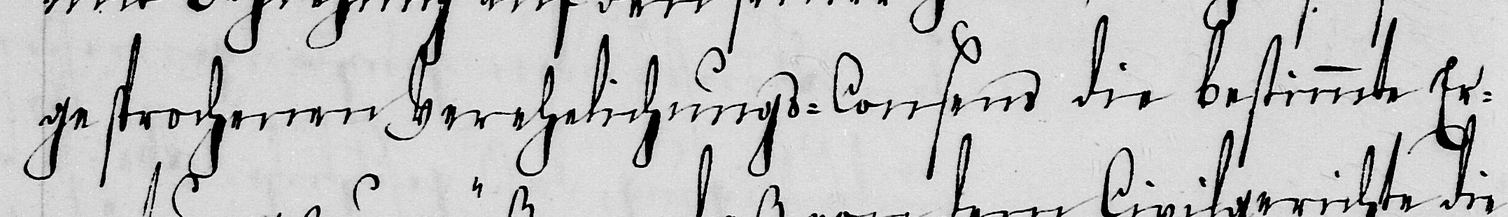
gesprochenen Verehelichungs-Consens die bestimmte Er¬
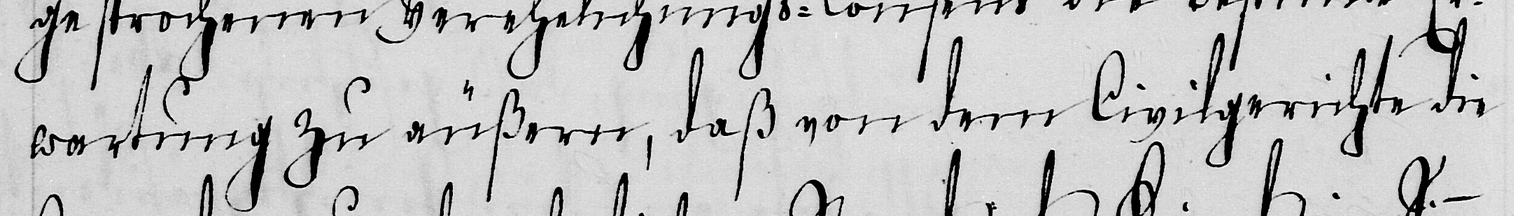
wartung zu äußern, daß von dem Civilgerichte die
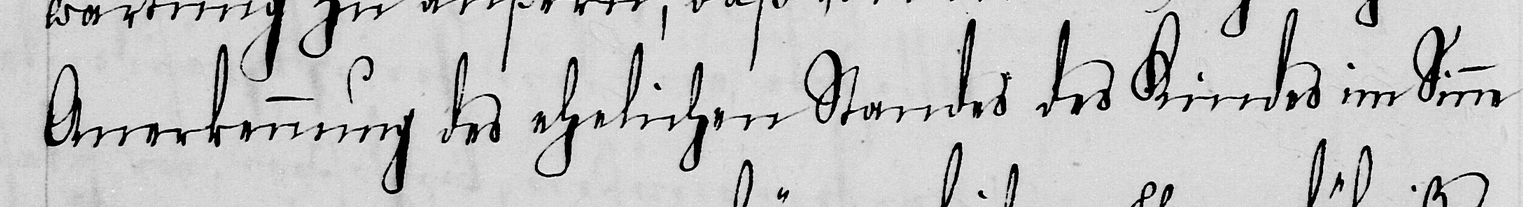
Anerkennung des ehelichen Standes des Kindes im Sin¬
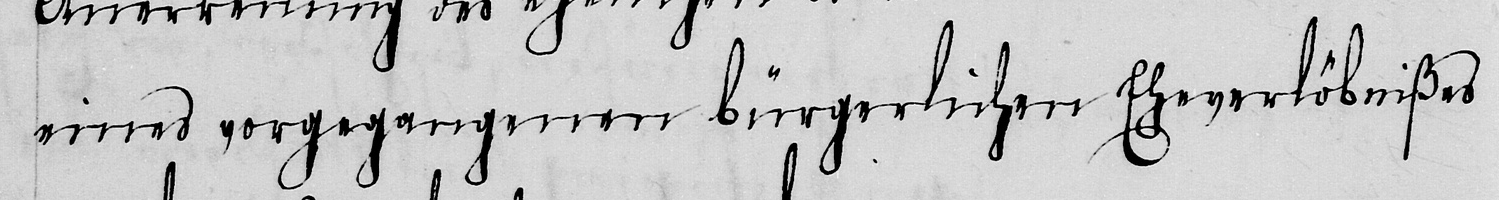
eines vorgegangenen bürgerlichen Eheverlöbnißes
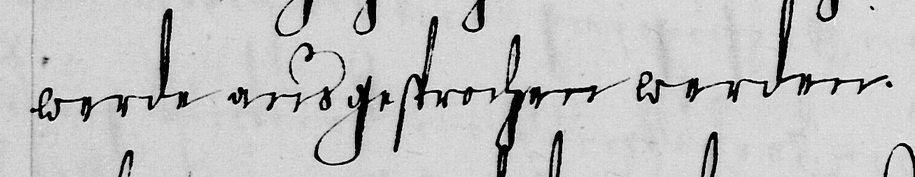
werde ausgesprochen werden.
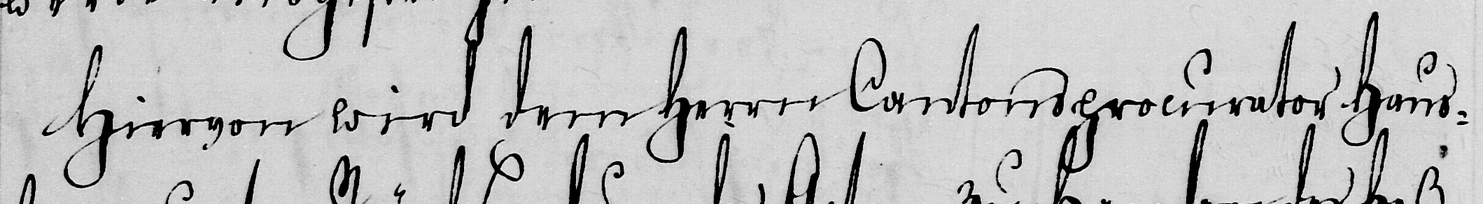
Hiervon wird dem Herrn Cantonsprocurator Haus¬
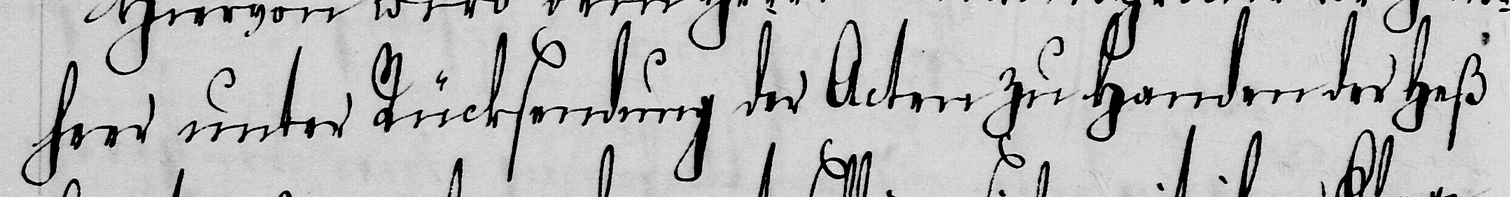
heer unter Rücksendung der Acten zu Handen der Heß
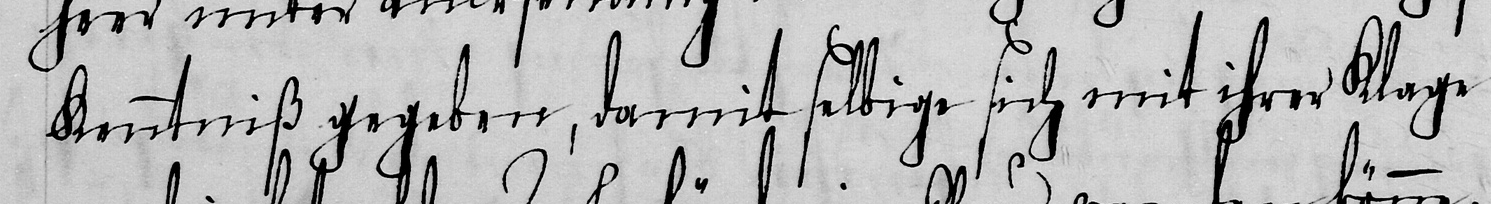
Kenntniß gegeben, damit selbige sich mit ihrer Klage
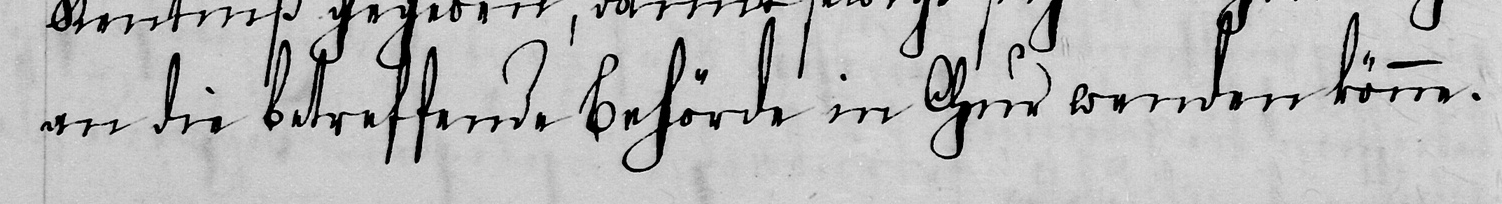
an die betreffende Behörde in Chur wenden könne.
